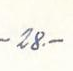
28
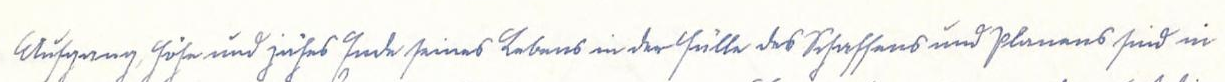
Aufgang, Höhe und jähes Ende seines Lebens in der Fülle des Schaffens und Planens sind in
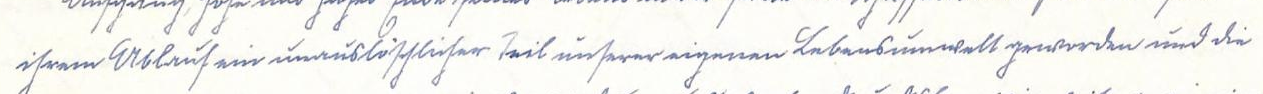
ihrem Ablauf ein unauslöschlicher Teil unserer eigenen Lebensumwelt geworden und die
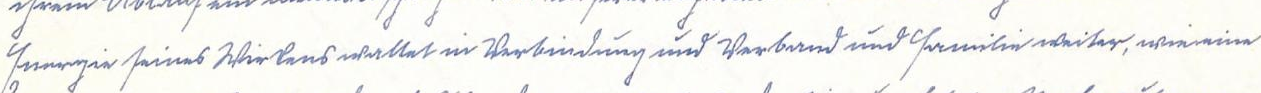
Energie seines Wirkens waltet in Verbindung und Verband und Familie weiter, wie eine
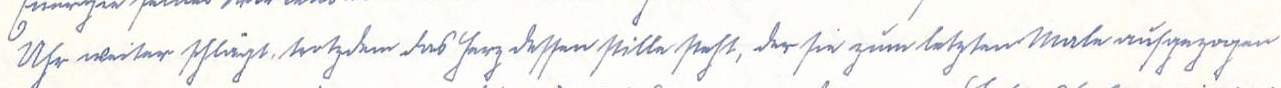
Uhr weiter schlägt, trotzdem das Herz dessen stille steht, der sie zum letzten Male aufgezogen
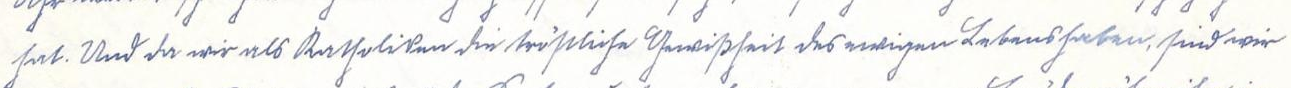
hat. Und da wir als Katholiken die tröstliche Gewißheit des ewigen Lebens haben, sind wir
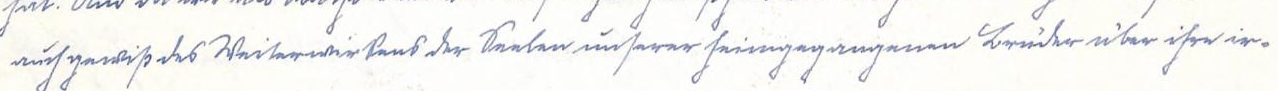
auch gewiß des Weiterwirkens der Seelen unserer heimgegangenen Brüder über ihre ir-
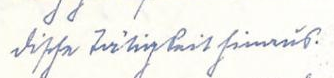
dische Tätigkeit hinaus.
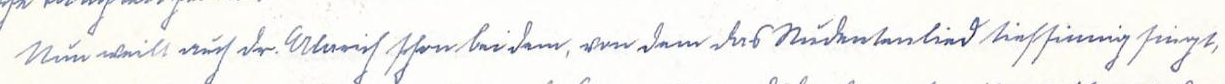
Nun weilt auch schon Dr. Alarich schon bei dem, von dem das Studentenlied tiefsinnig singt,
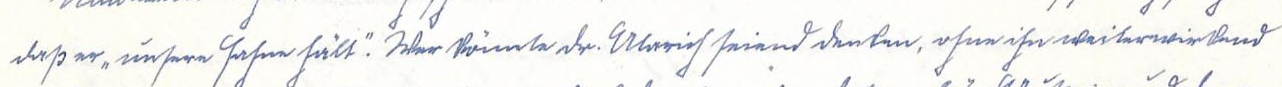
daß er „unsere Fahne hält“. Wer könnte Dr. Alarich seiend denken, ohne ihn weiterwirkend
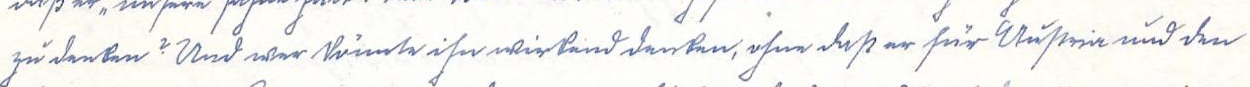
zu denken? Und wer könnte ihn wirkend denken, ohne dass er für Austria und den
